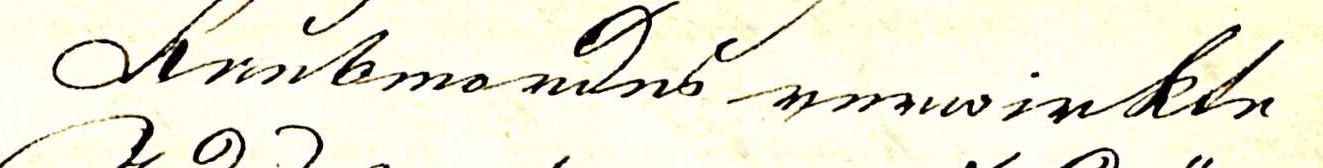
Raubmordes verwirkte
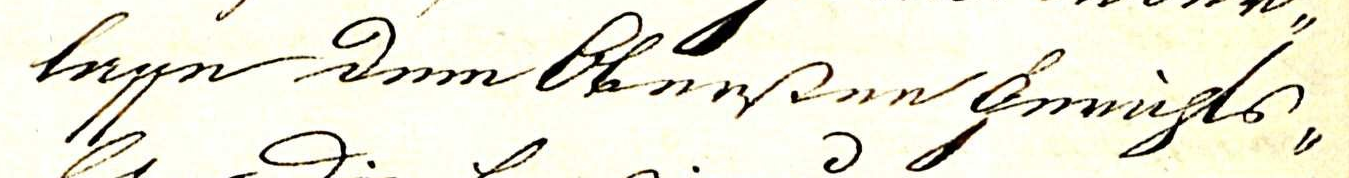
lasse dem Obersten Gerichts¬
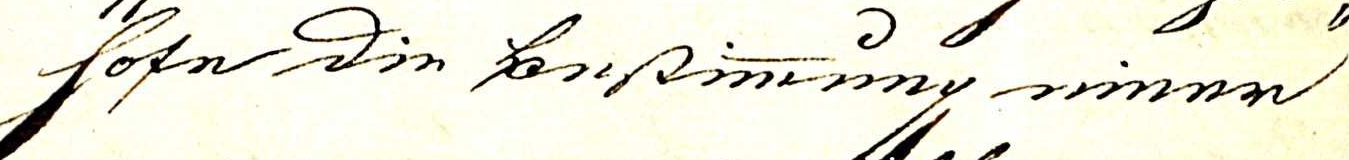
hofe die Bestimmung einer
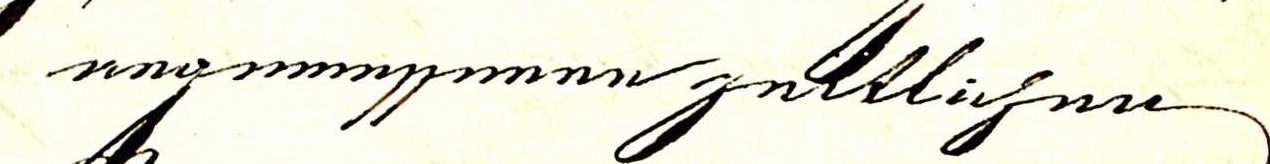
angemeßenen zeitlichen
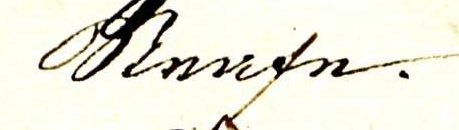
Strafe.
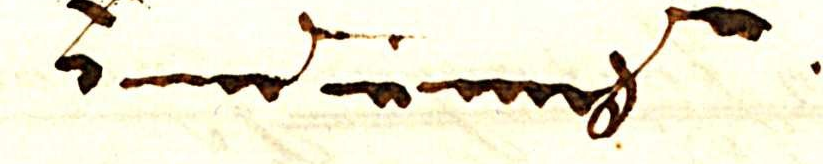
Ferdinand
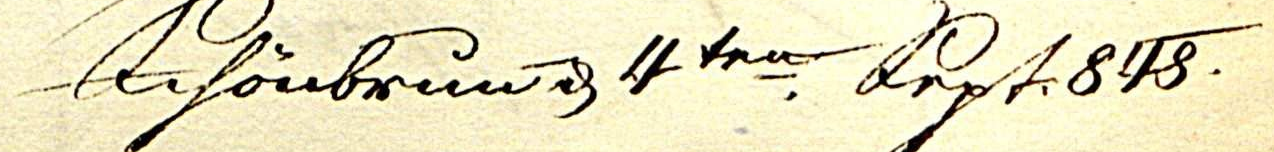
Schönbrunn den 4ten. Sept. [1]848
